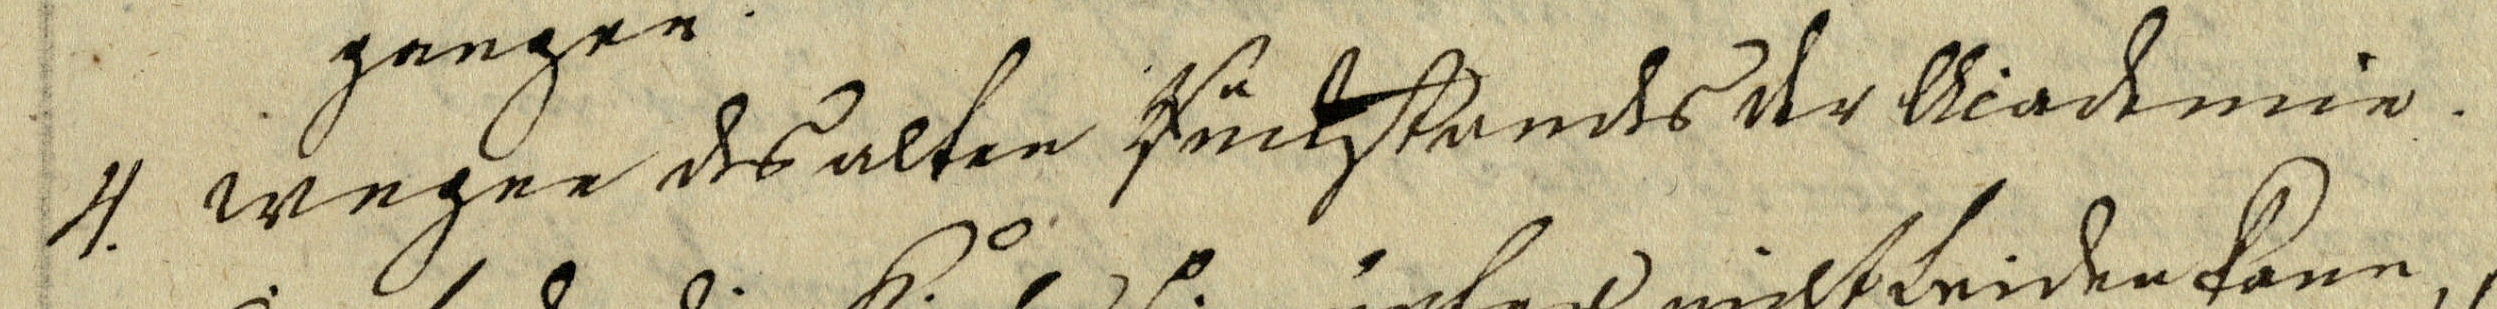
4. wegen des alten Rückstands der Academie
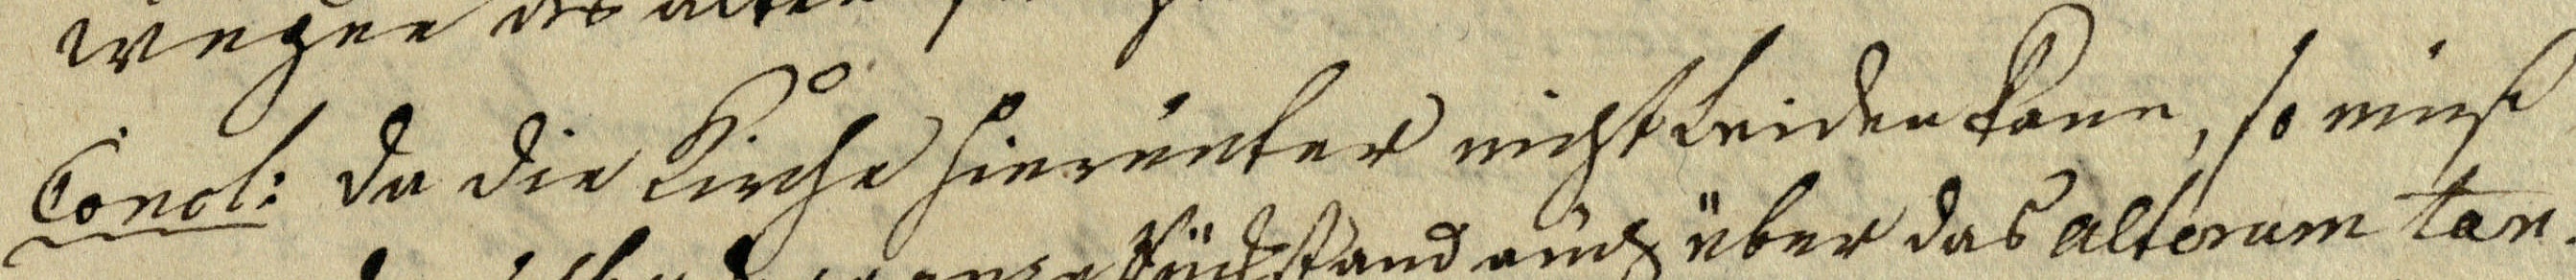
Concl. da die Kirche hierunter nicht leiden kann, so muß
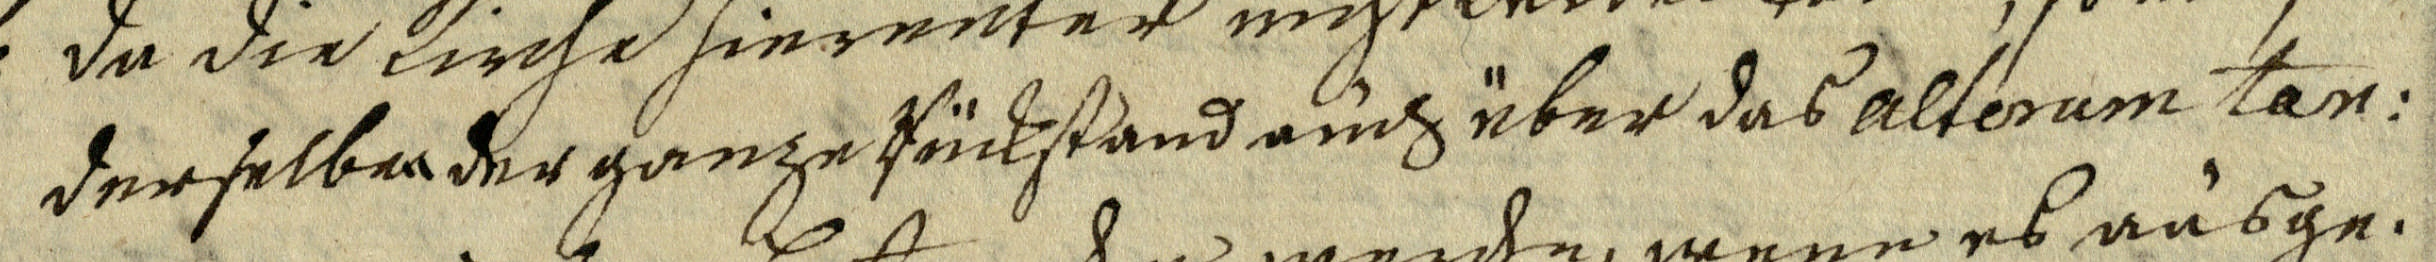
derselben der ganze Rückstand auch über das alterum tan¬
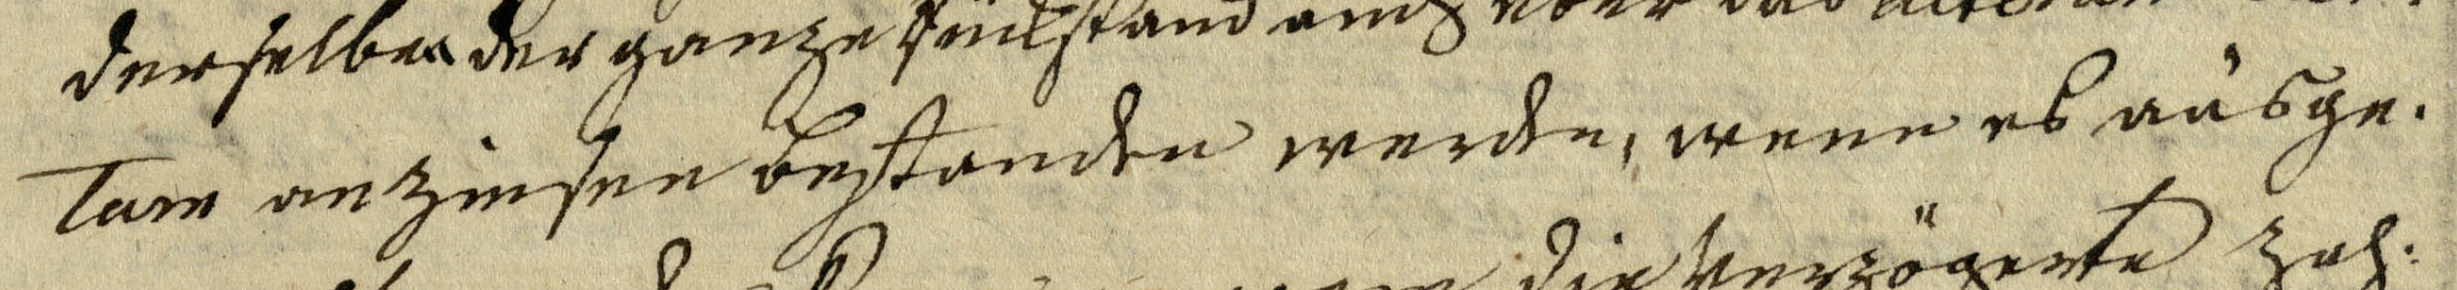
tam an Zinsen bestanden werden, wenn es ausge¬
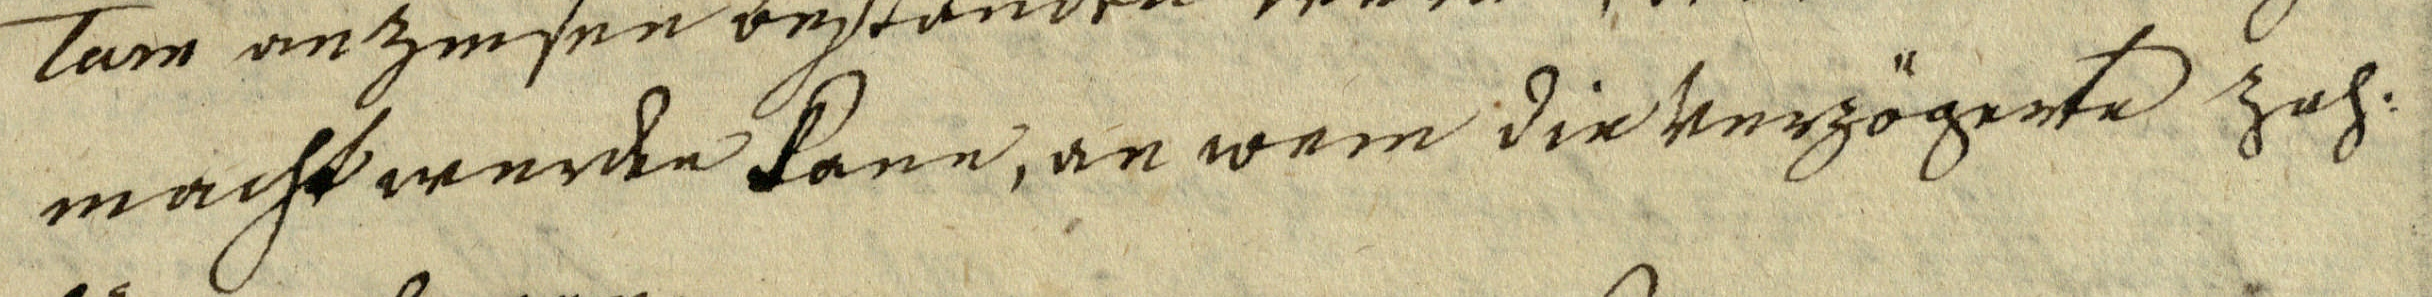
macht werden kann, an wem die verzögerte Zah¬
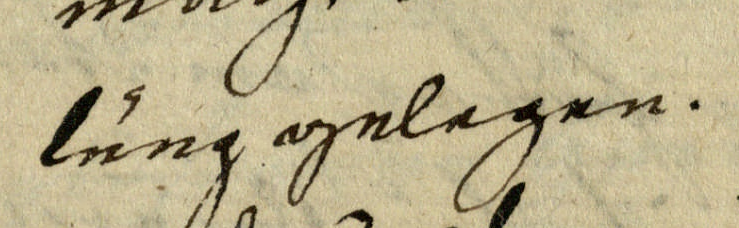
lung gelegen.
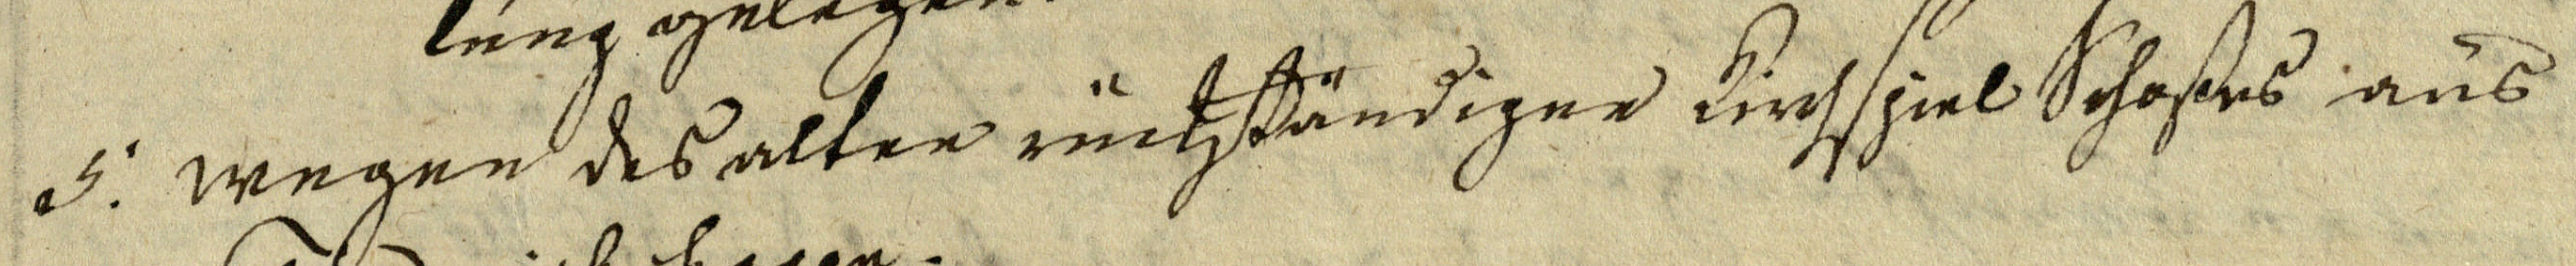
5. wegen des alten rückständigen Kirchspiel Schoßes aus
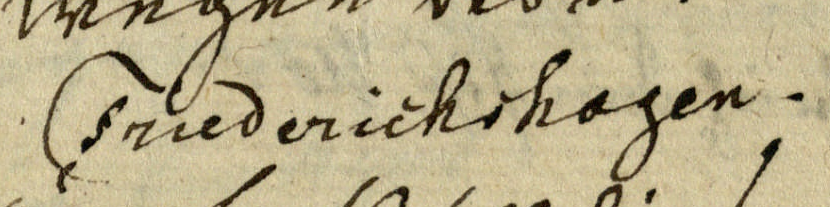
Friederichshagen.
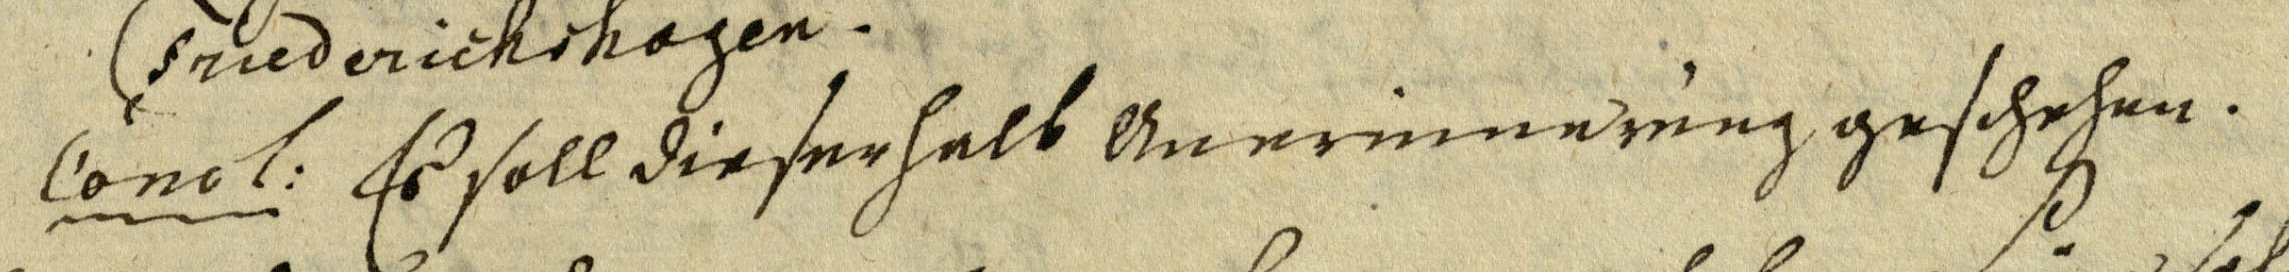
Concl. Es soll dieserhalb Anerinnerung geschehen.
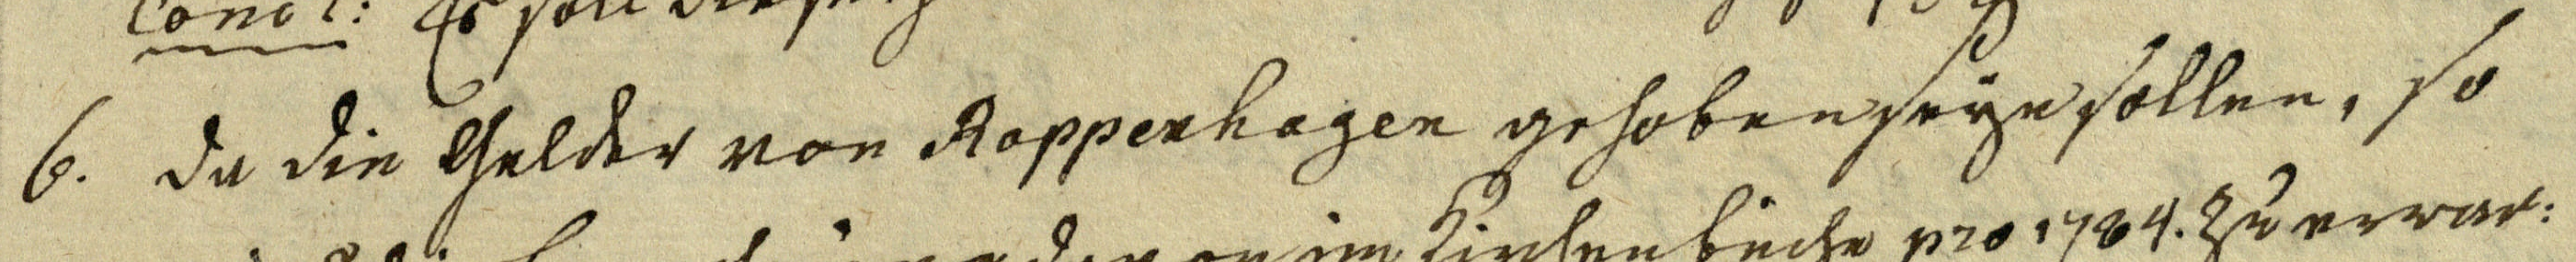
6. da die Gelder von Rappenhagen gehoben seÿn sollen, so
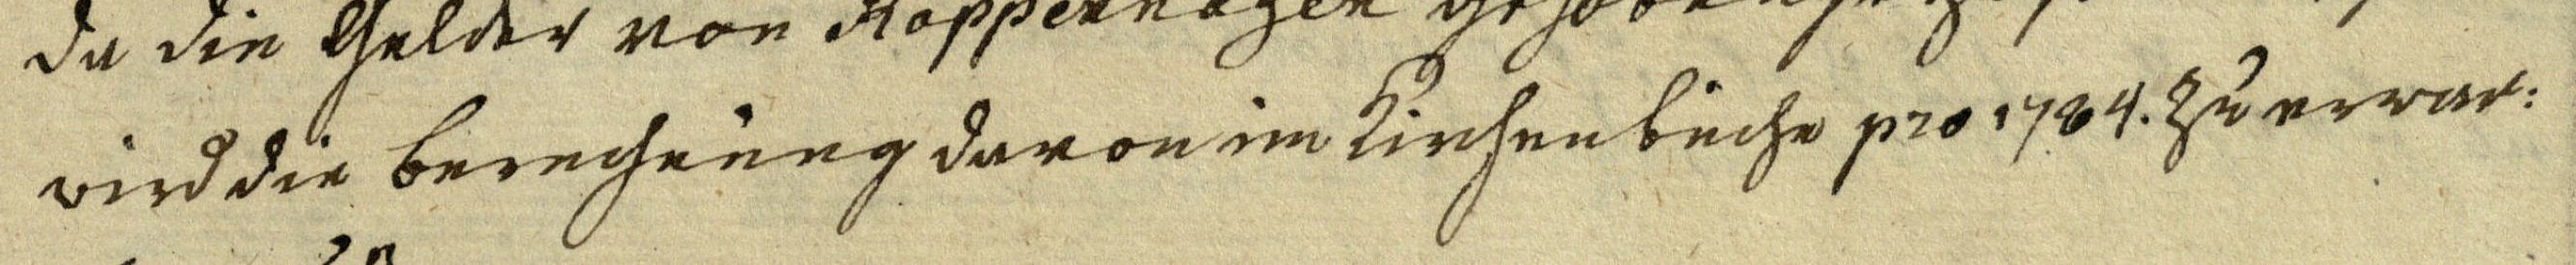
wird die Berechnung davon im Kirchbuche pro 1784. zu erwar¬
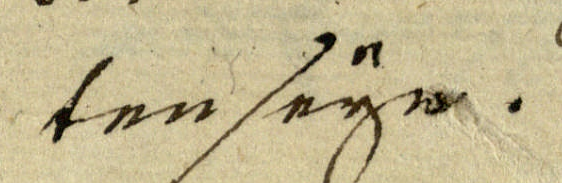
ten seÿn.
